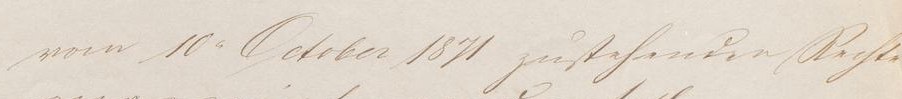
vom 10t October 1871 zustehenden Rechte
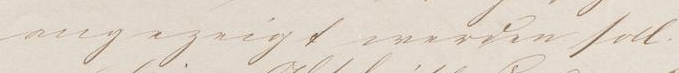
angezeigt werden soll.
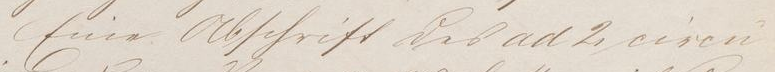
Eine Abschrift des ad 2. circu-
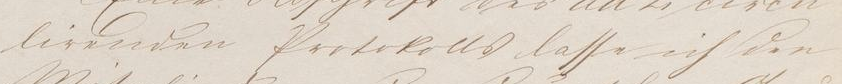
lirenden Protokolls lasse ich den
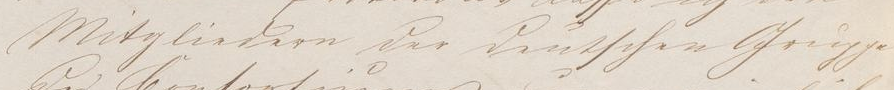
Mitgliedern der deutschen Gruppe
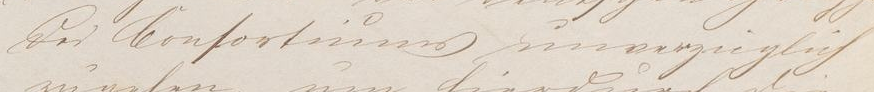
des Consortiums unverzüglich
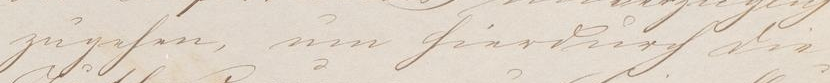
zugehen, um hierdurch die
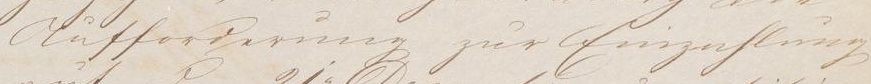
Aufforderung zur Einzahlung
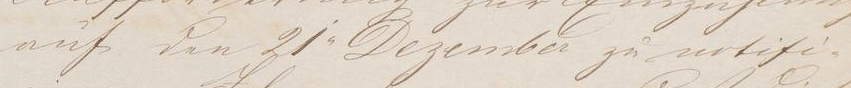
auf den 21t Dezember zu notifi-
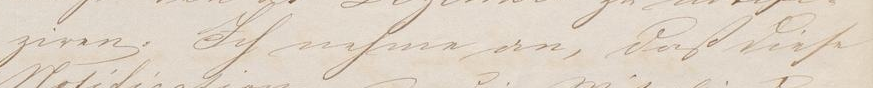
ziren . ich nehme an, daß diese
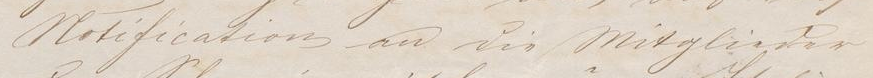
Notification an die Mitglieder
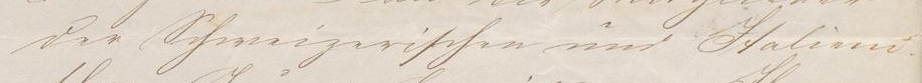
der Schweizerischen und Italieni-
